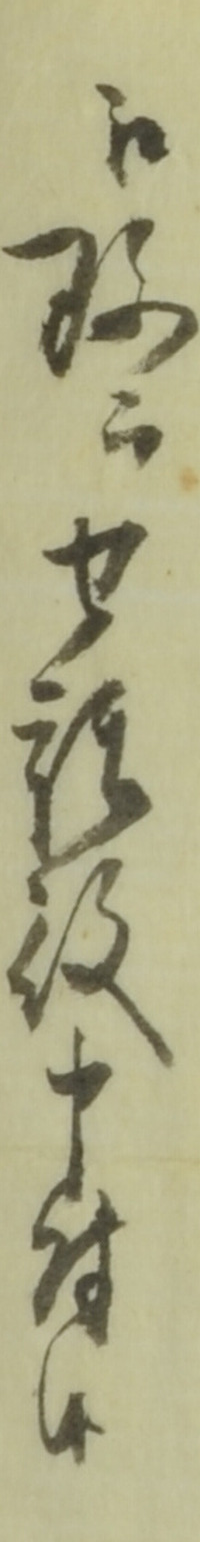江改而せ話役申付候

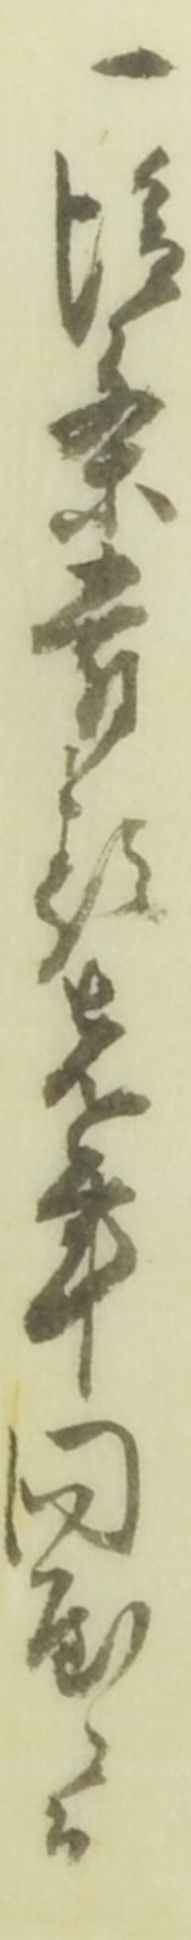一塩茶肴趣先年問屋ニ而
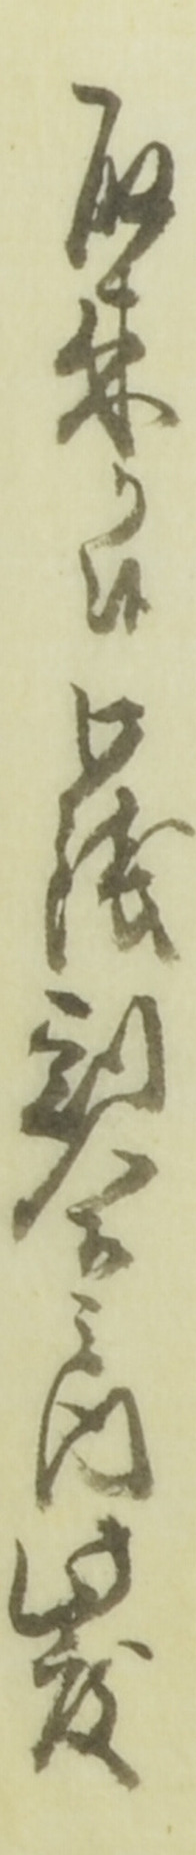取来リ候口銭割合之内此度
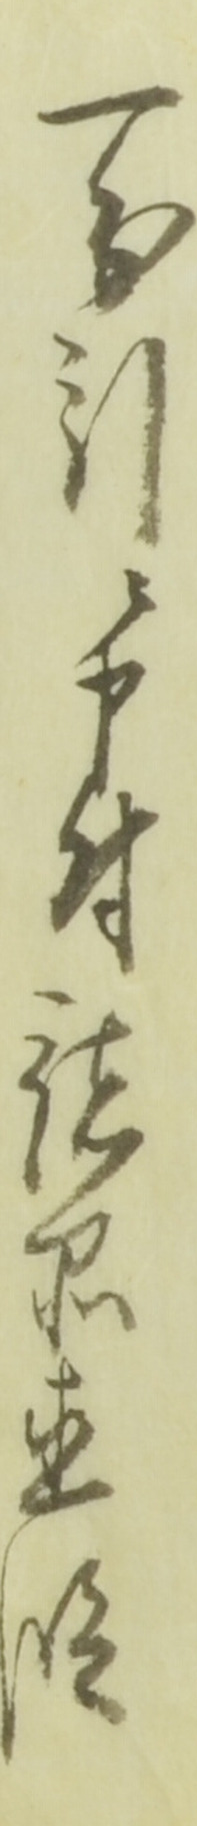一分引ニ申付諸品直段
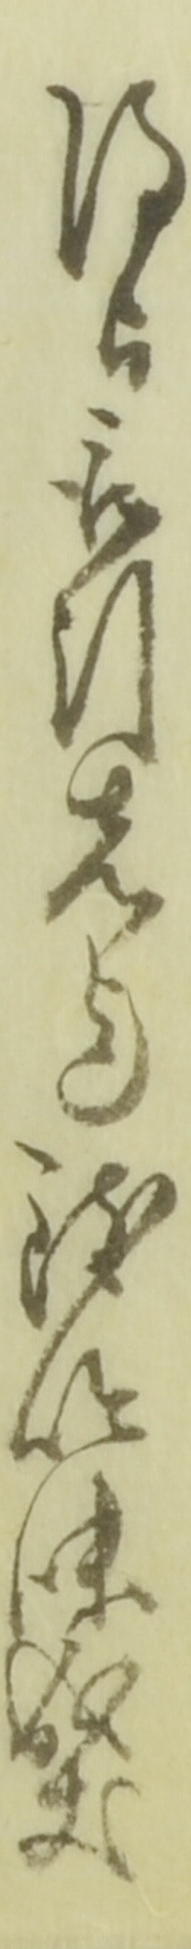得与取引先迄致吟味成丈
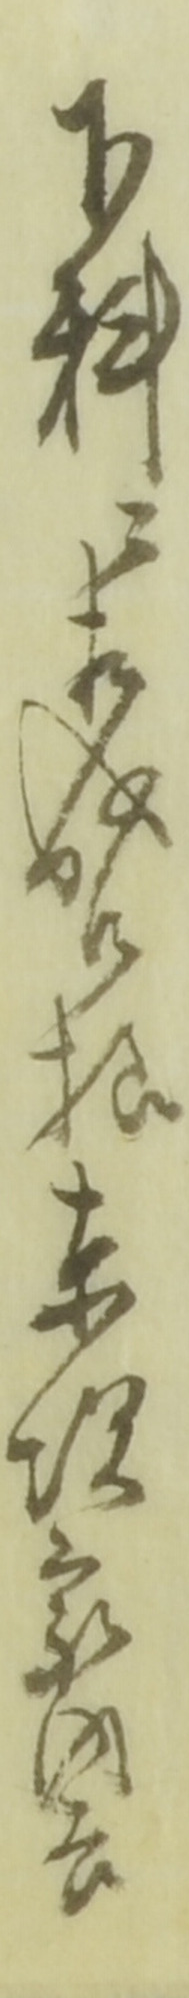下料ニ相成候様東次家内吉
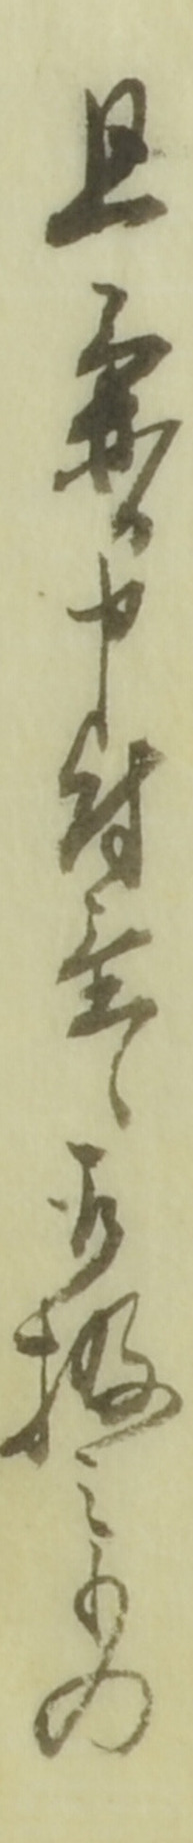且兼而申付置候取扱之もの
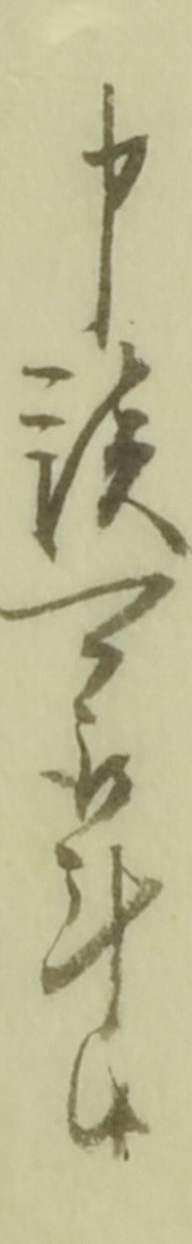申談可取斗候
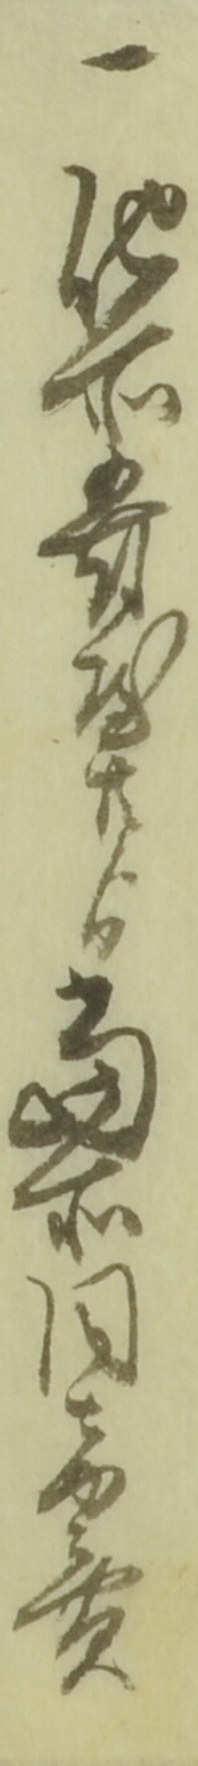一他所肴屋共ゟ当所同商売
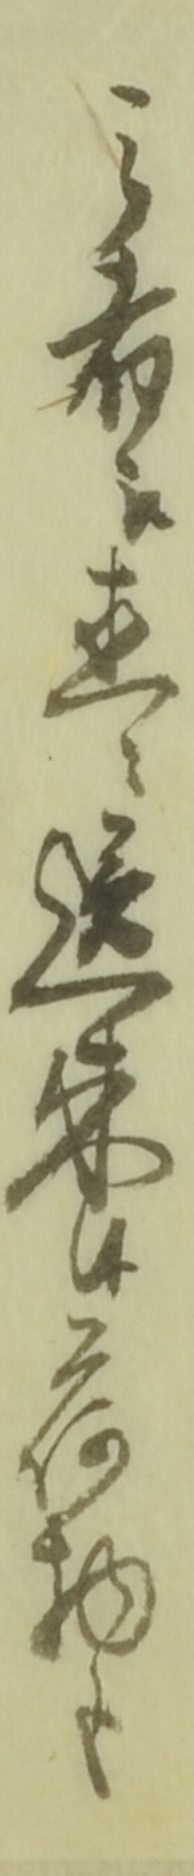之者江直々送来候荷物も
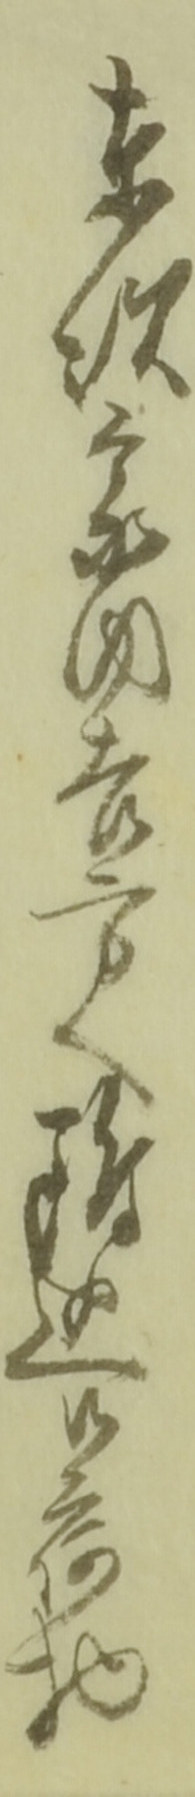東次家内吉方へ附込候荷物
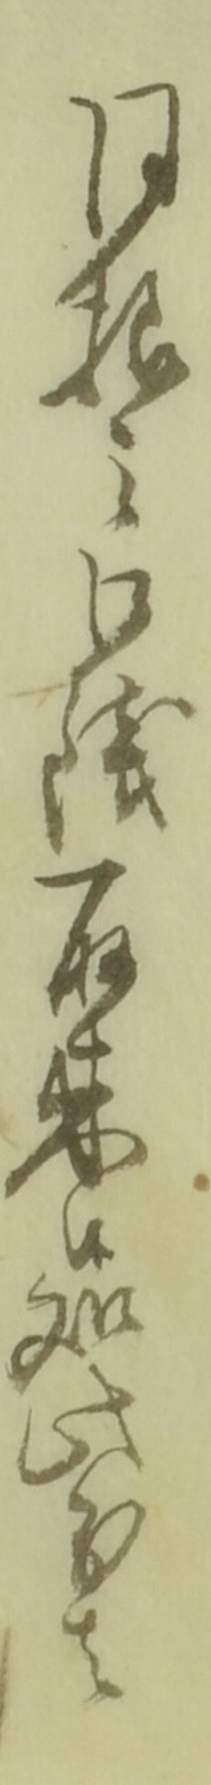同様之口銭取来候処此分者
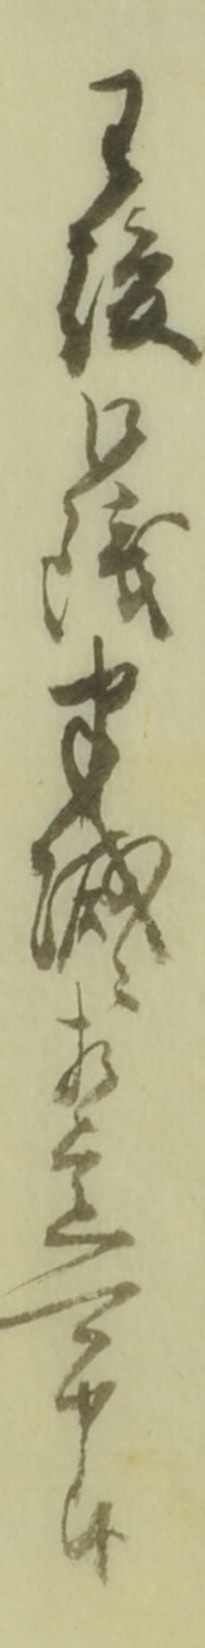己後口銭半減ニ相意可申候
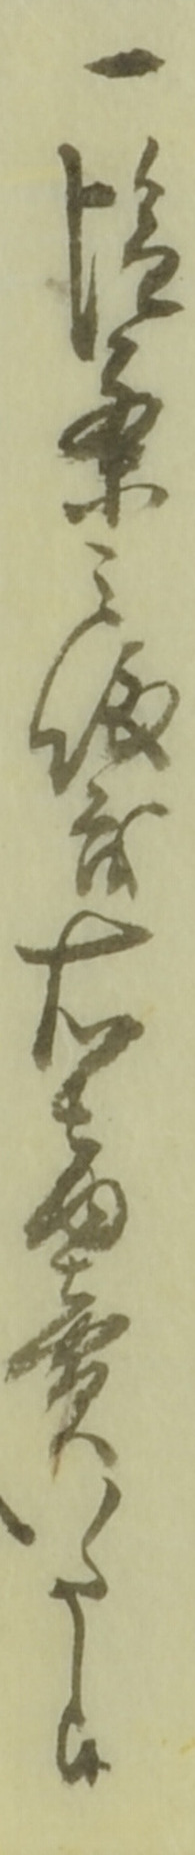一塩茶之儀茂右商売いたし候
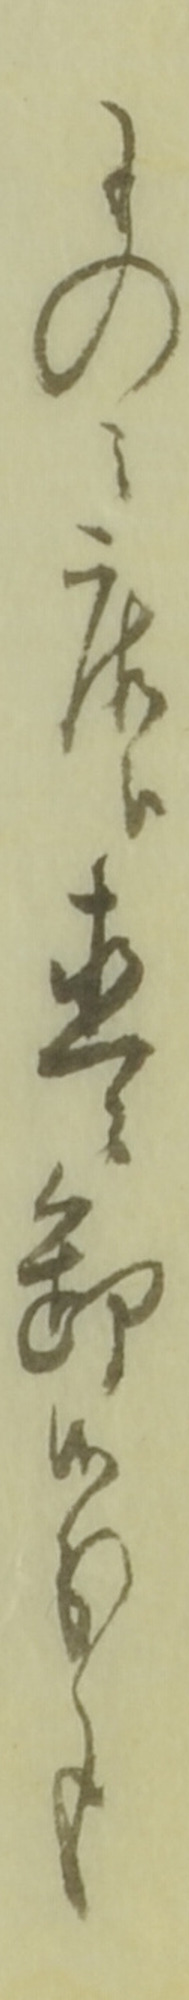もの之店江直々卸候分も
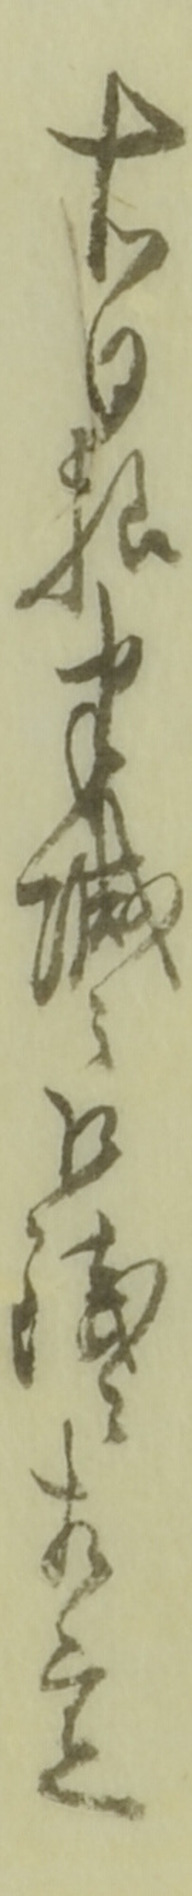右同様半減之口銭ニ相意
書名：御触書御書附控
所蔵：伊那市立高遠町図書館・合同会社AMANE
